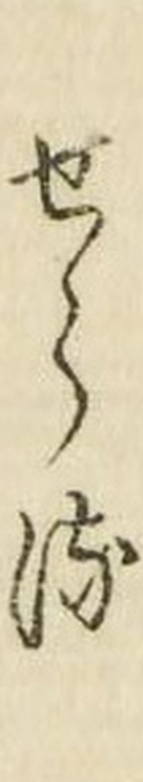せらる
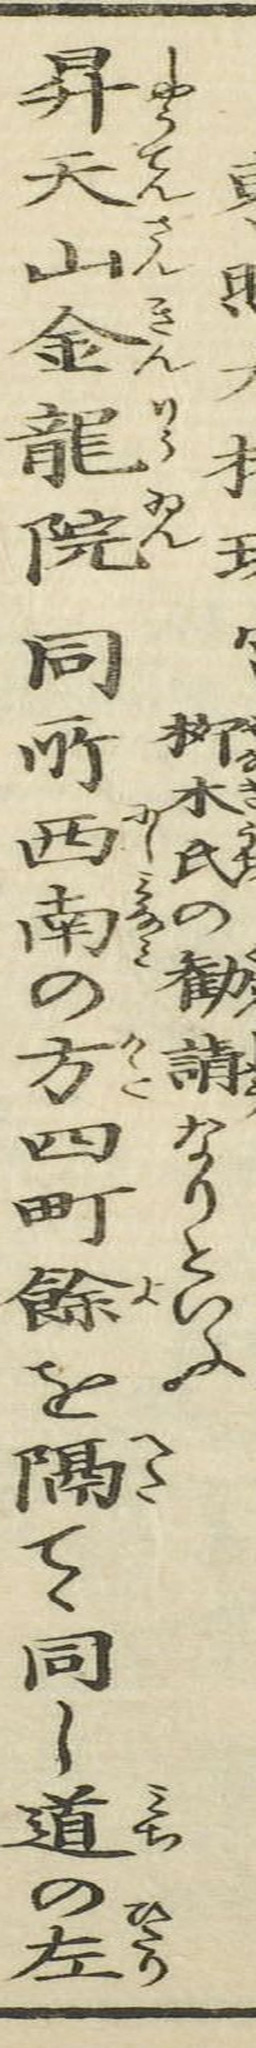昇天山金龍院同所西南の方四町餘を隔てゝ同し道の左
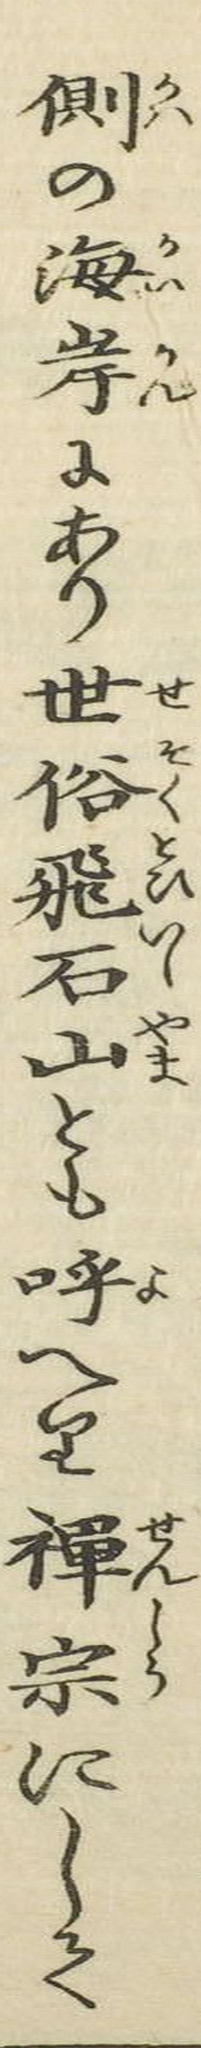側の海岸にあり世俗飛石山とも呼禪宗にして
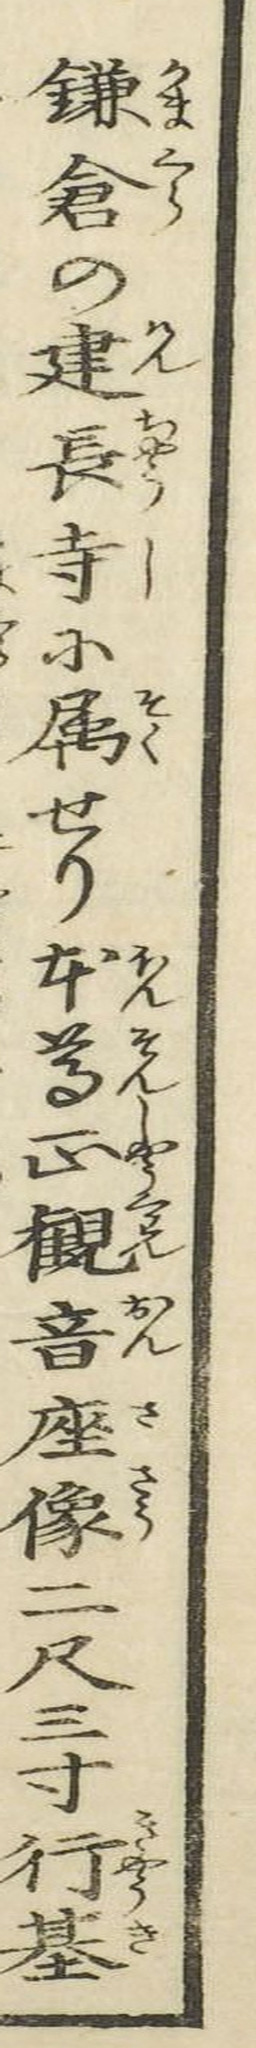鎌倉の建長寺に属せり本尊正観音座像二尺三寸行基
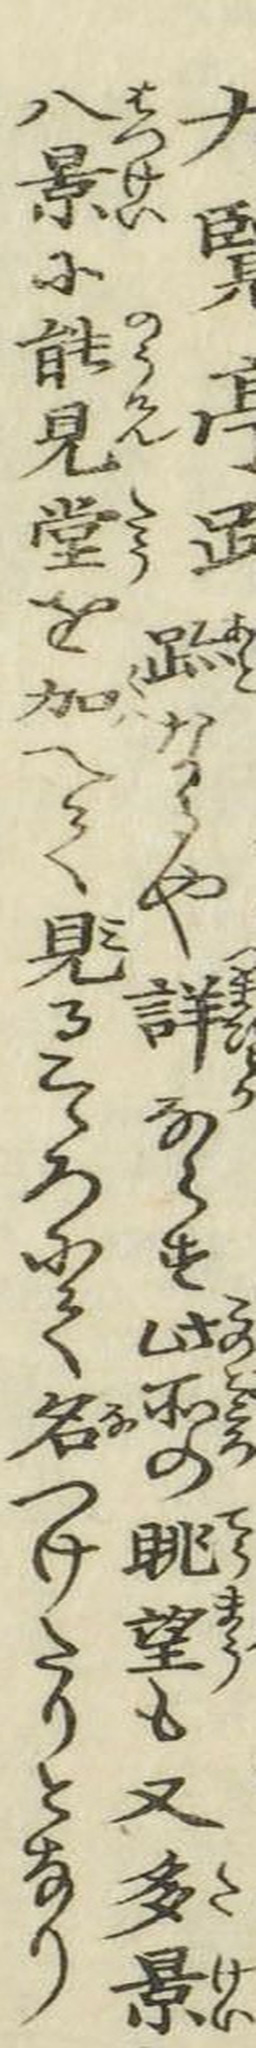八景の能見堂を加へて見るこゝろにて名つけたりとなり
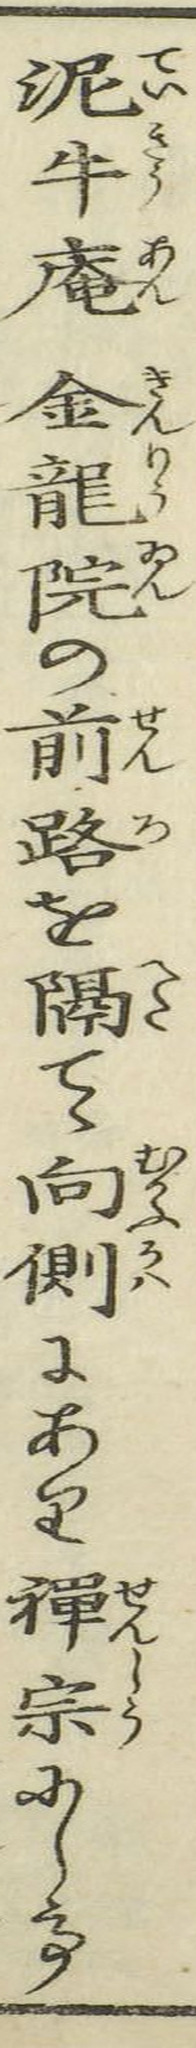泥牛庵金龍院の前路を隔てゝ向側にあり禪宗にして
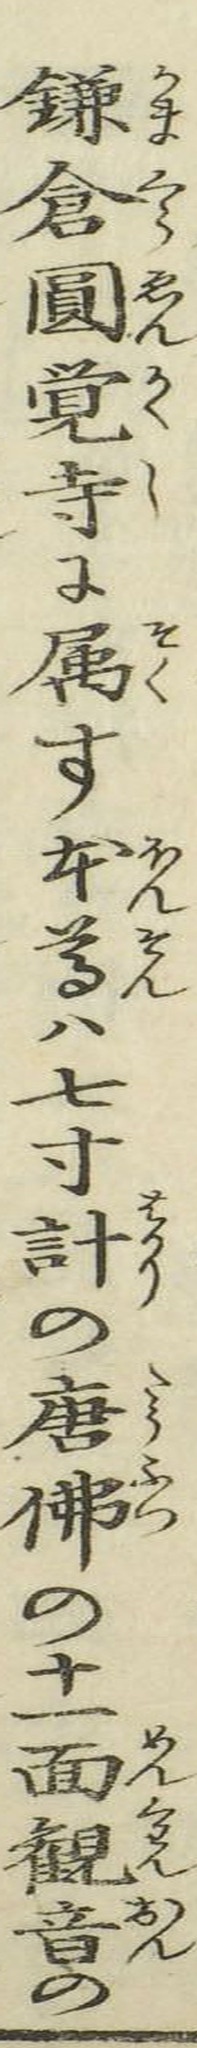鎌倉圓覚寺に属す本尊は七寸計の唐佛の十一面観音の
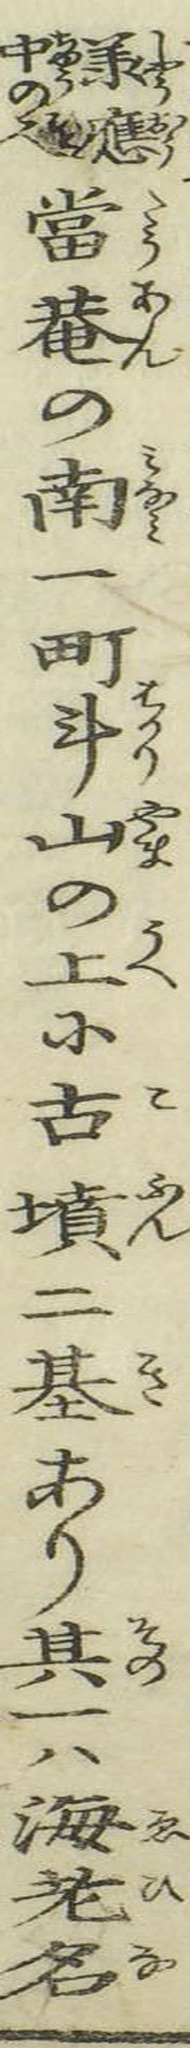承應中の人當菴の南一町斗山の上に古墳二基あり其一は海老名
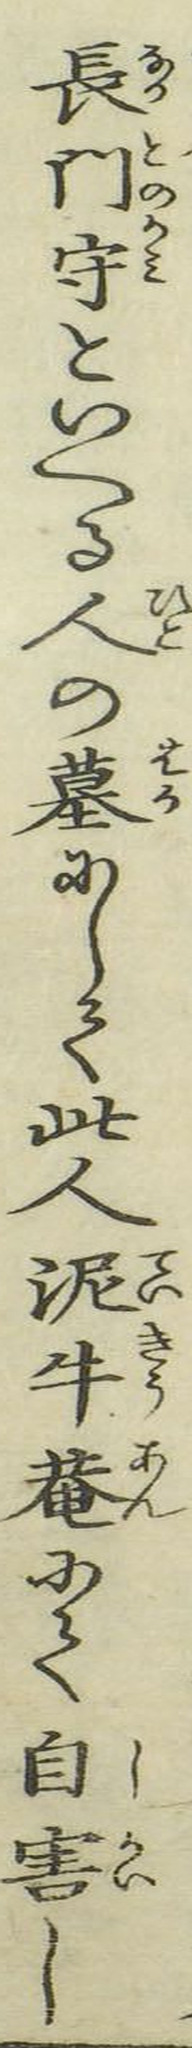長門守といへる人の墓にして此人泥牛菴にて自害し

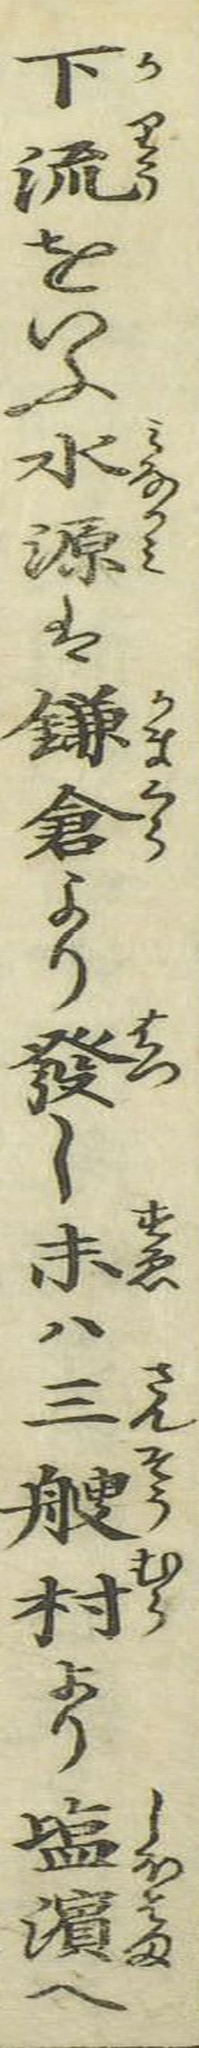下流をいふ水源は鎌倉より発し末は三艘村より塩浜へ
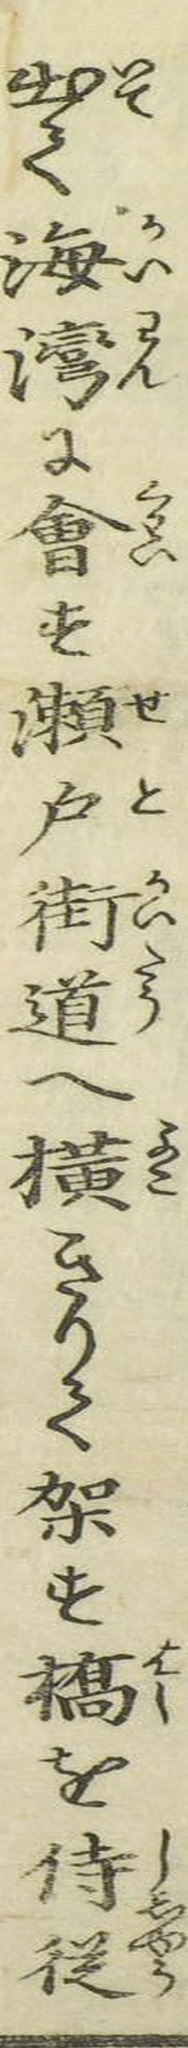出て海湾に会す瀬戸街道へ横きりて架す橋を侍従
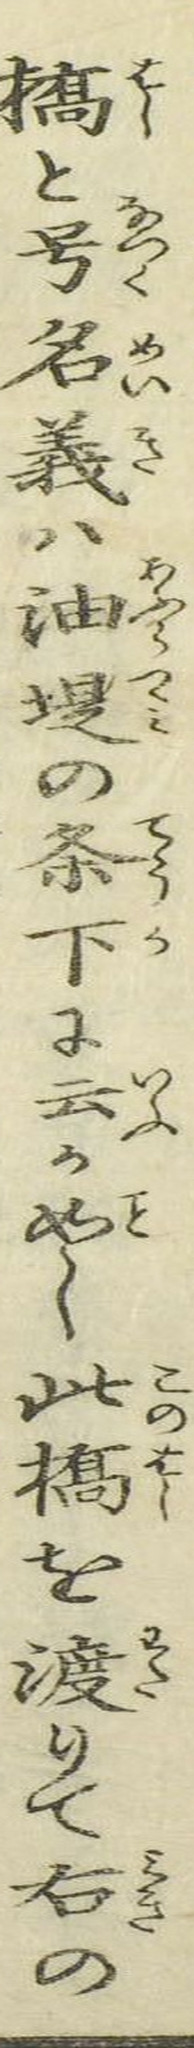橋と号名義は油堤の条下に云か如し此橋を渡りて右の
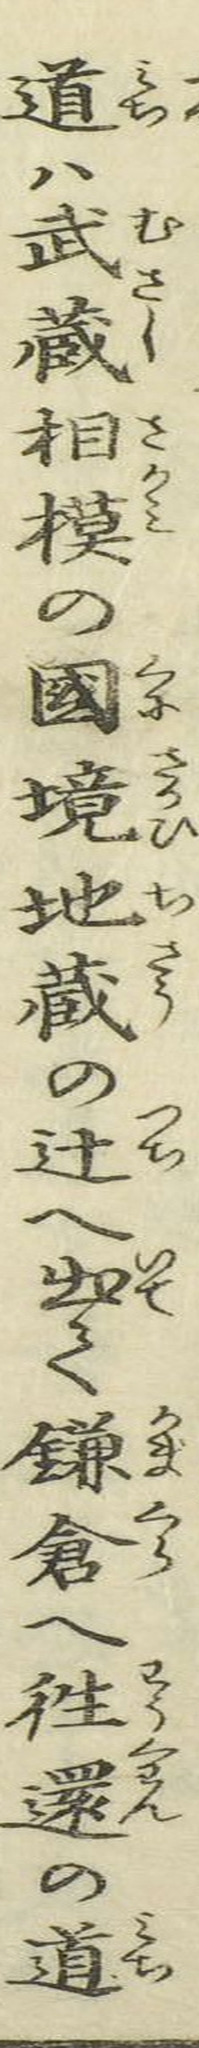道は武蔵相撲の国境地蔵の辻へ出て鎌倉へ往還）の道
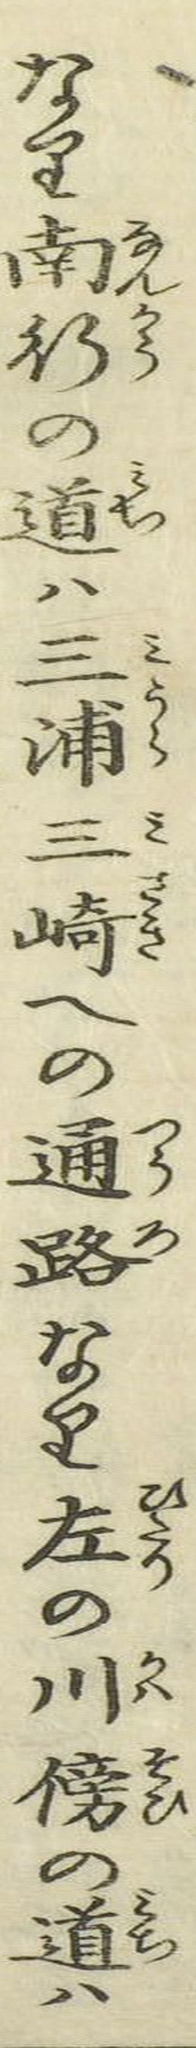なり南行の道は三浦三崎への通路なり左の川傍の道は
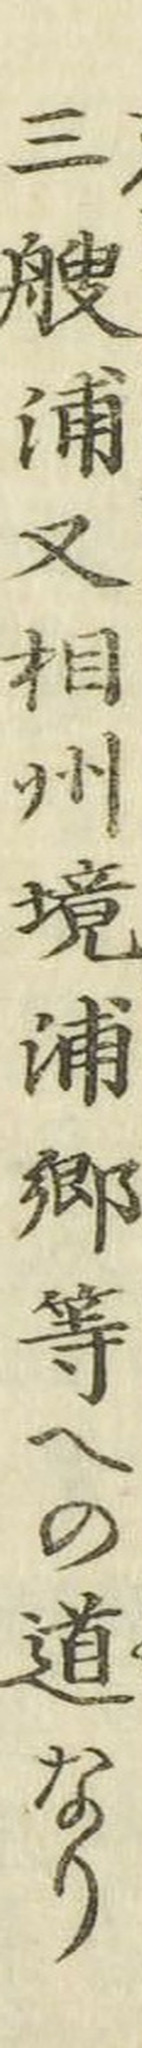三艘浦又相州境浦郷等への道なり
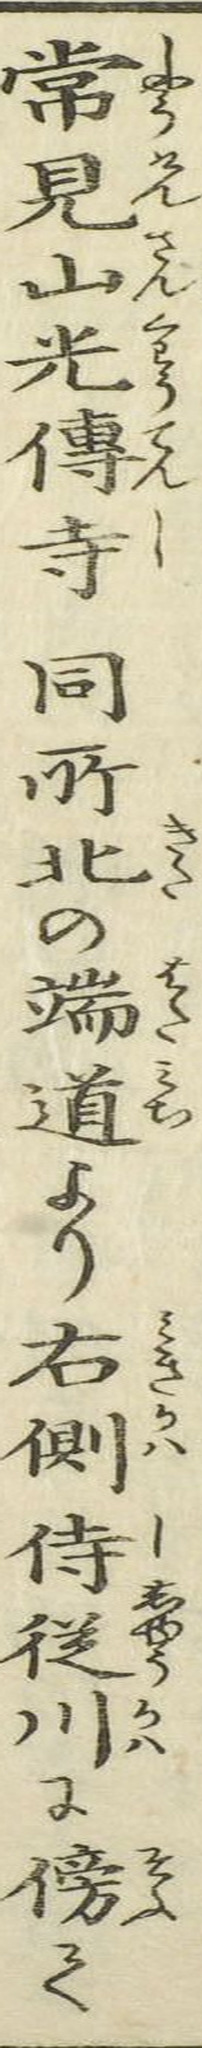常見山光伝寺同所北の端道より右側侍従川に傍て
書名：江戸名所図会 20巻 巻之6
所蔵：東京学芸大学教育コンテンツアーカイブ
